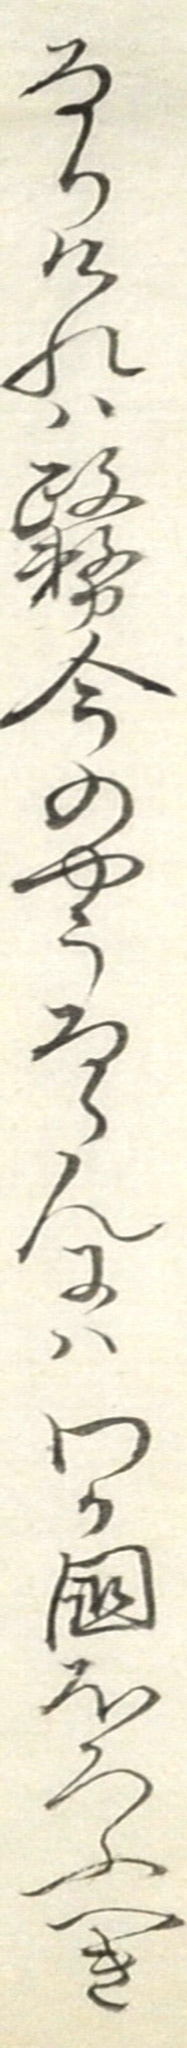なりけれは政務今のやうならんにはわか国ほろふへき
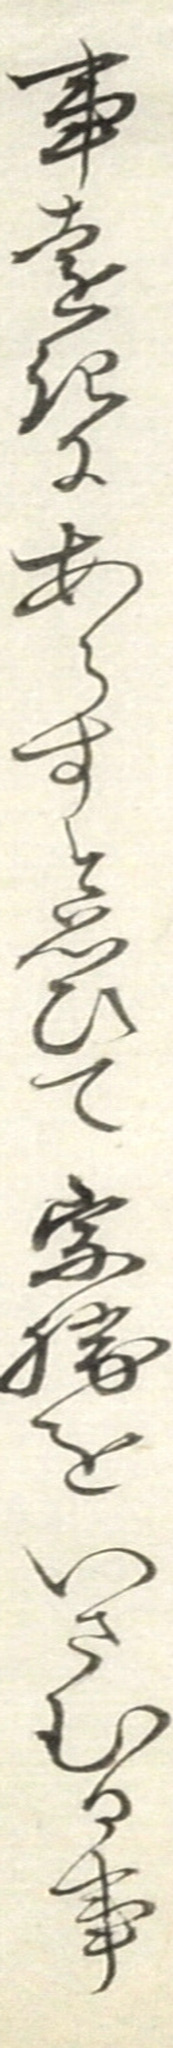事遠きにあらすと思ひて宗勝をいさむる事
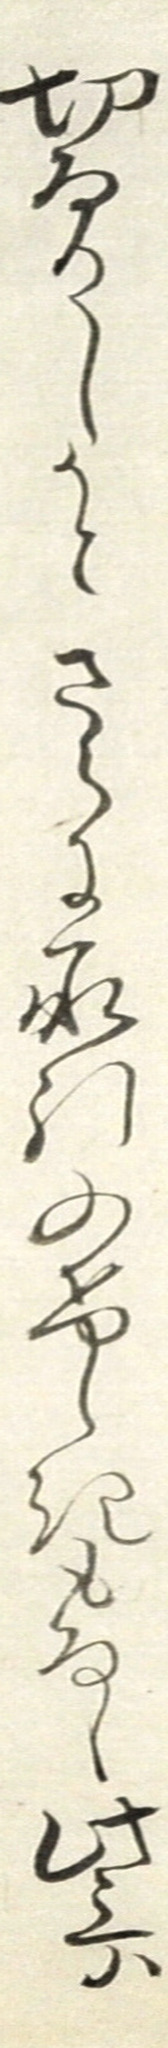切なりしかとさらに承引のけしきもなし此上は
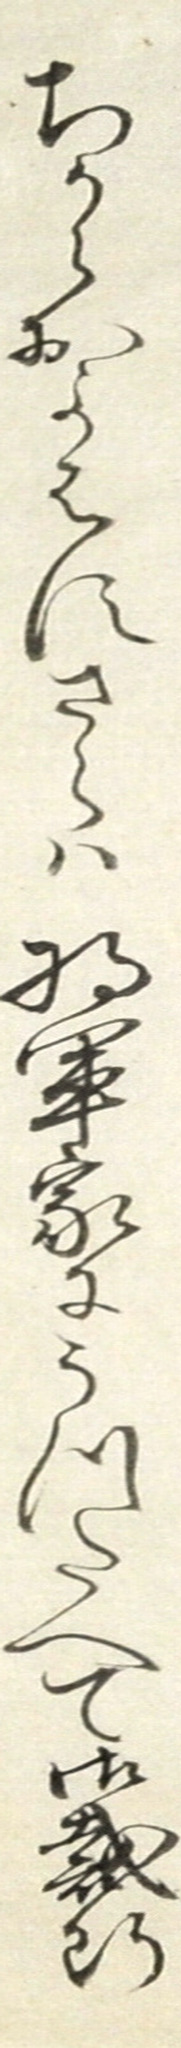ちからおよはすさらは将軍家にうつたへて御裁断
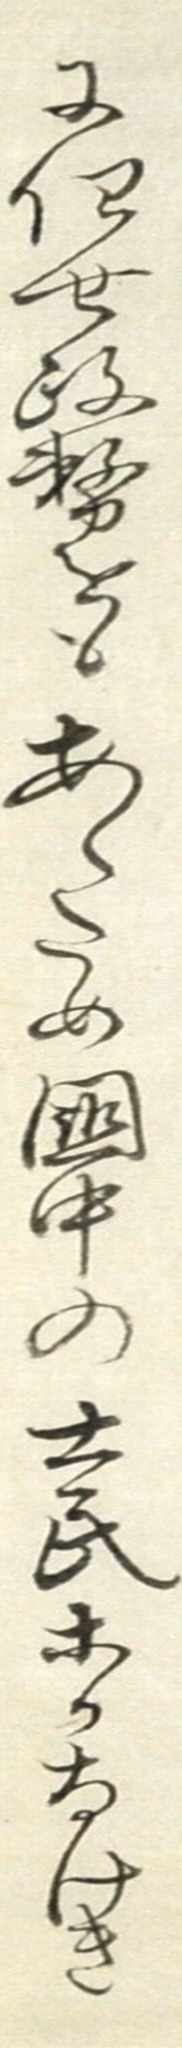に任せ政務をもあらため国中の士民等かなけき
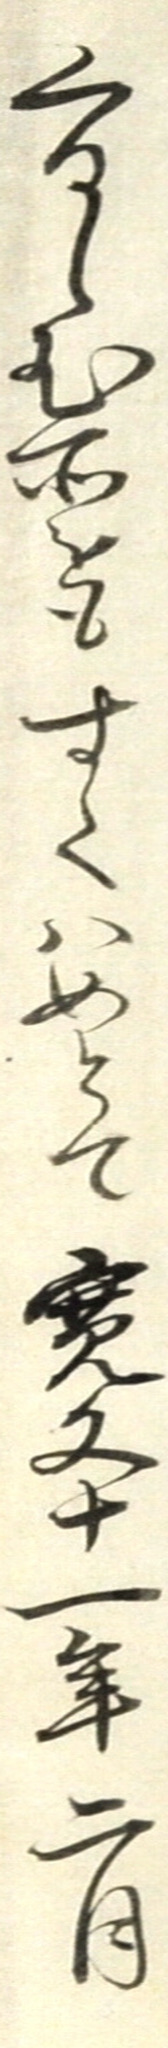くるしむ所をもすくはめとて寛文十一年二月

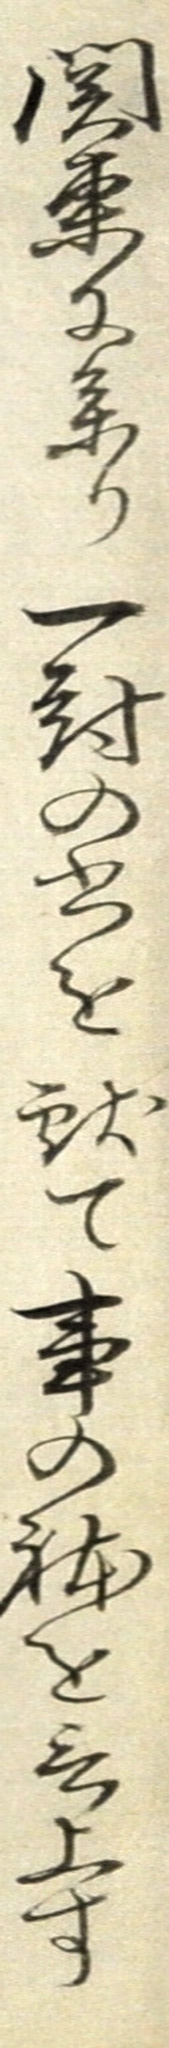関東に参り一封の書を献て事の体を言上す
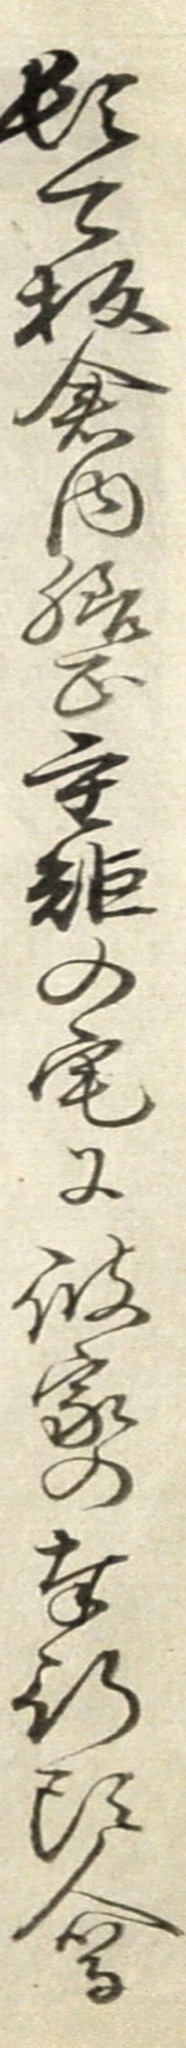頓て板倉内膳正重矩の宅に彼家の奉行頭人等
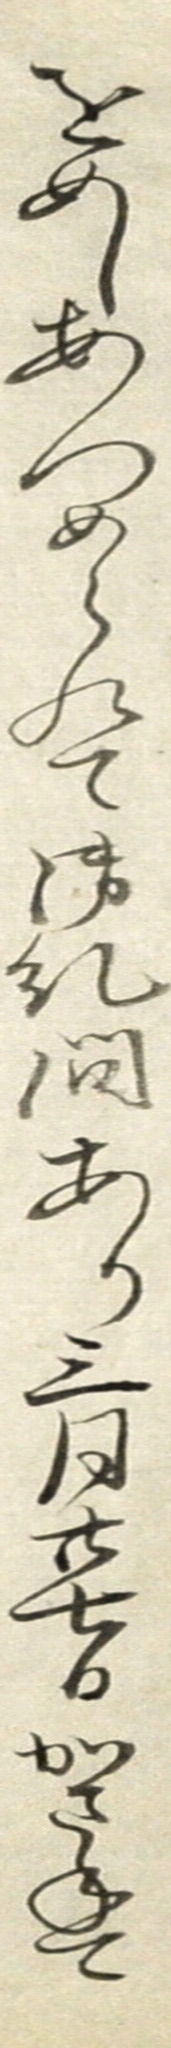をめしあつめられて御糺問あり三月廿七日かさねて
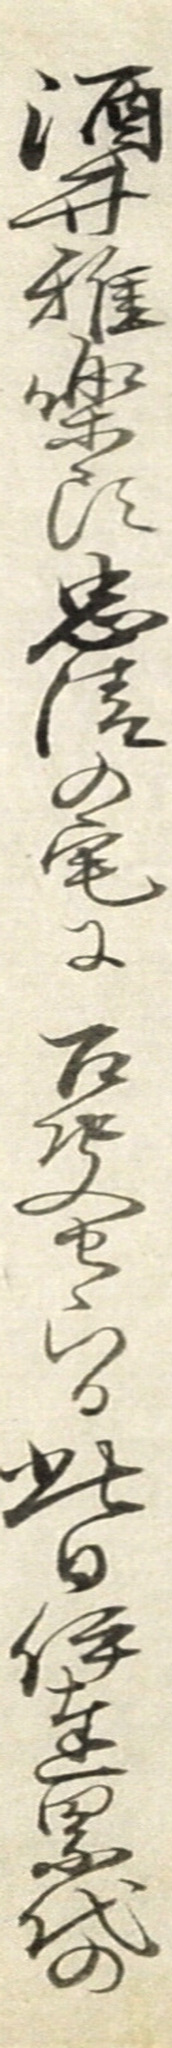酒井雅楽頭忠清の宅に召決せらる此日伊達累代の
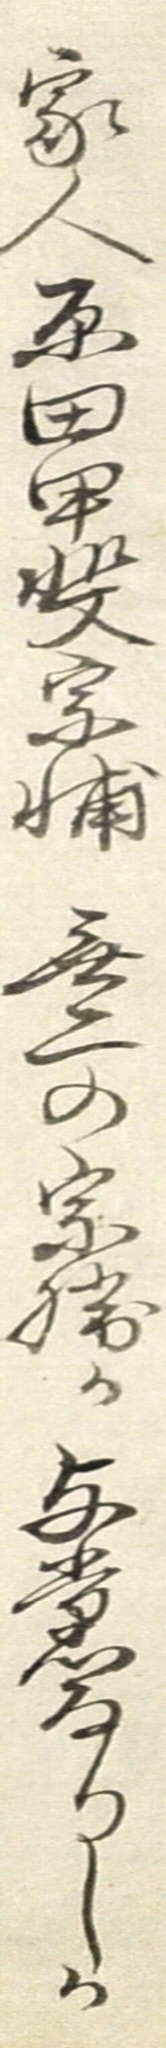家人原田甲斐宗輔無二の宗勝か与党なりしか
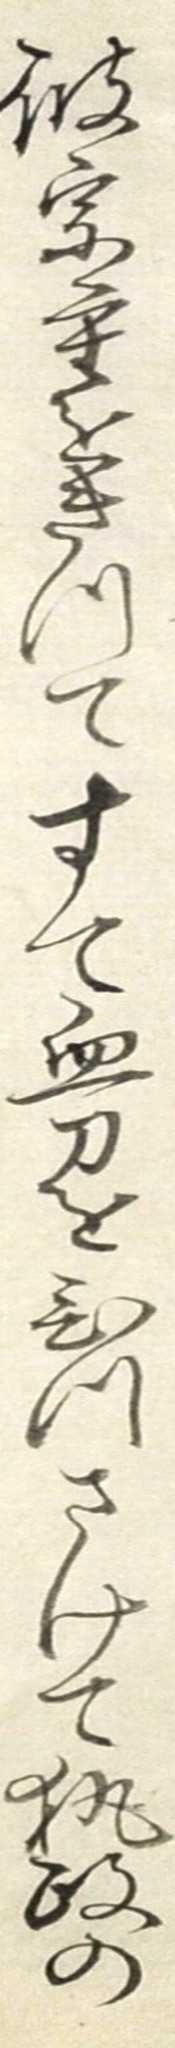彼宗重をきつてすて血刀をひつさけて執政の
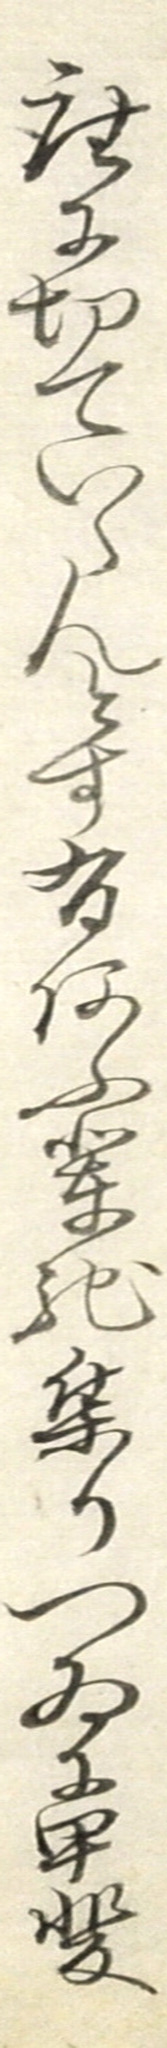座に切ていらんとす有あふ輩馳集りつゐに甲斐
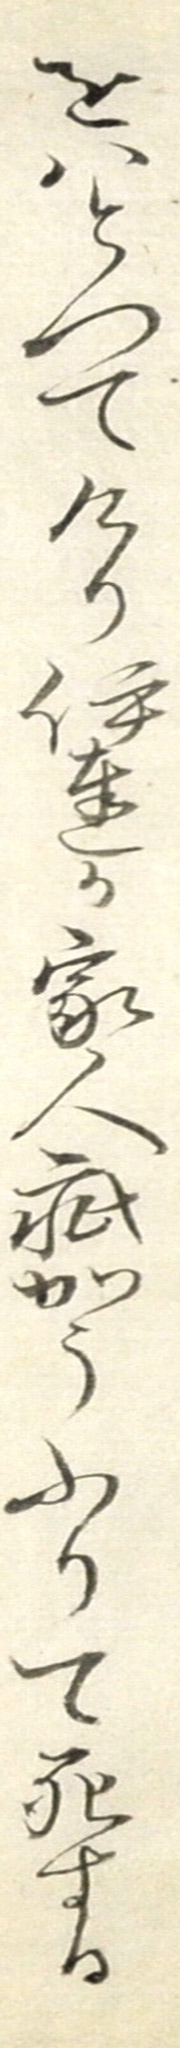をはとつてけり伊達か家人疵かうふりて死する
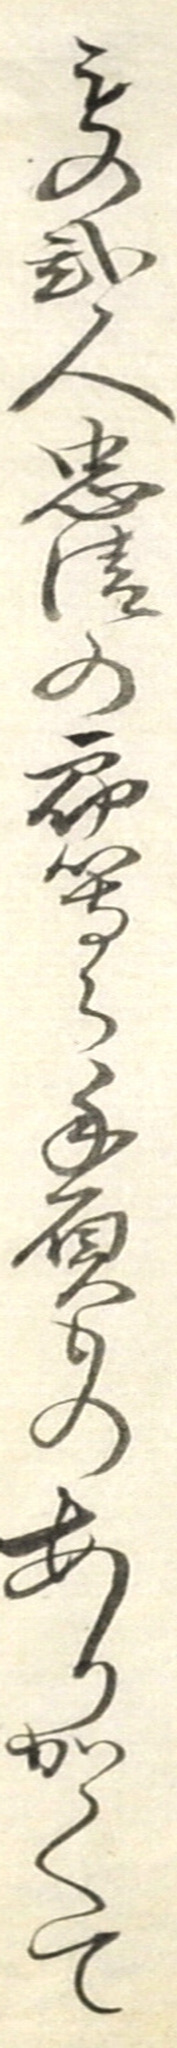もの弐人忠清の郎等ら手負ものありかくて
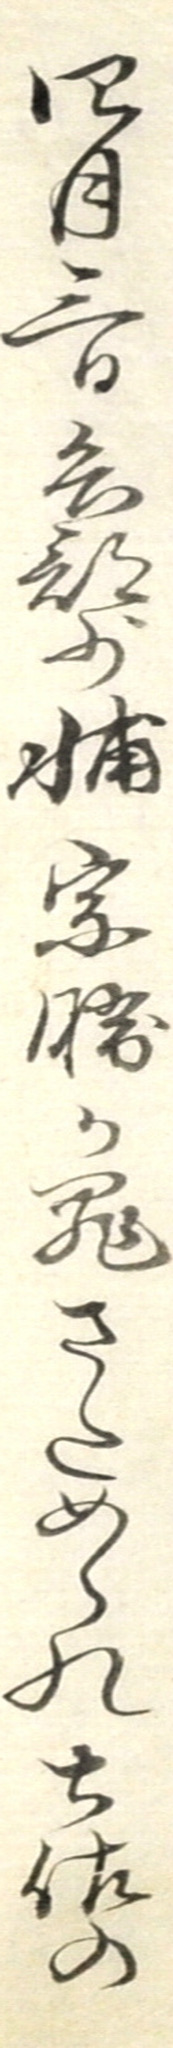四月三日兵部少輔宗勝か罪さためられ土佐の
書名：藩翰譜（七・下）
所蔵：伊那市立高遠町図書館・合同会社AMANE
